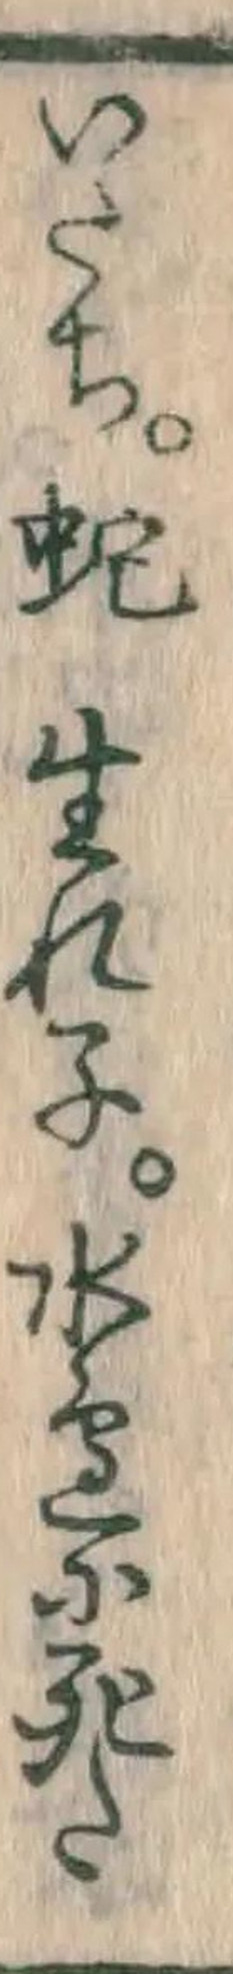いたち。蛇生れ子。水辺に死た
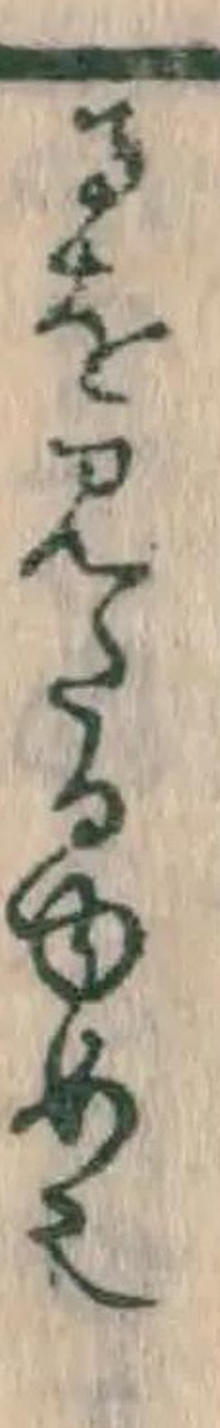るを見たるゆめ也
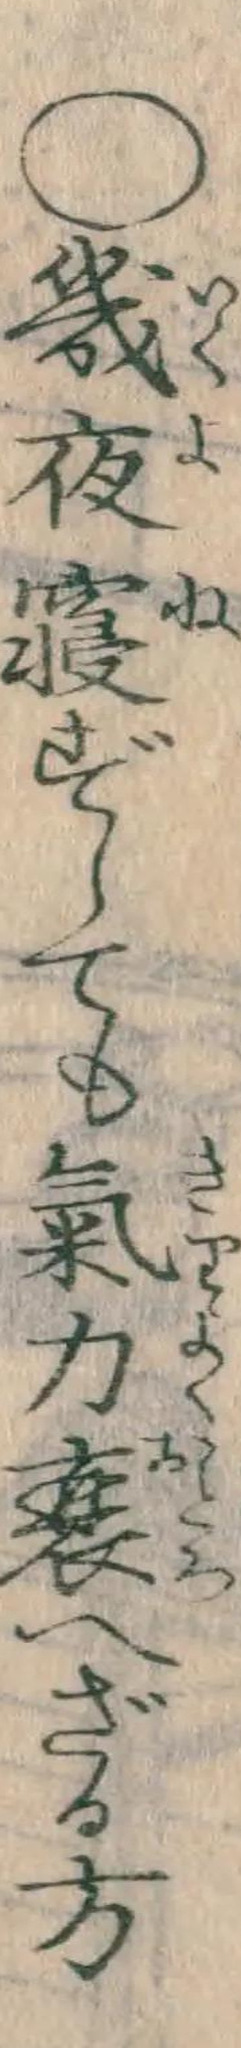○幾夜寝ずしても気力衰へざる方
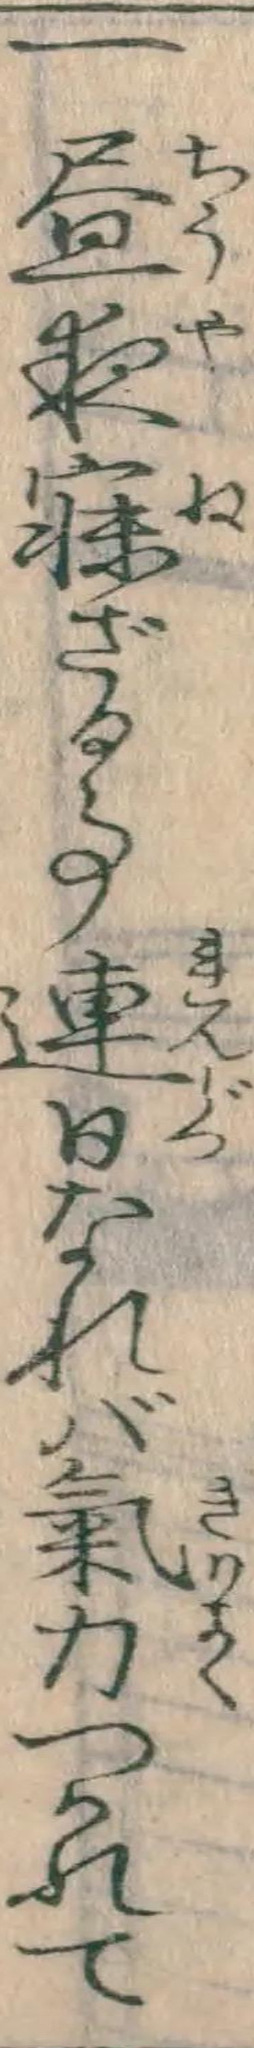一昼夜寝ざる事連日なれば気力つかれて
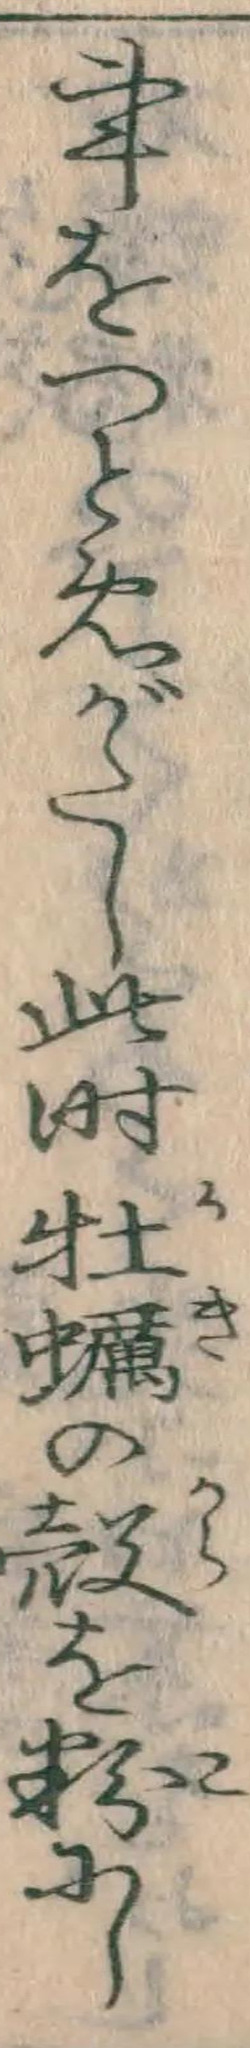事をつとめがたし此時牡蠣の殻を粉にし
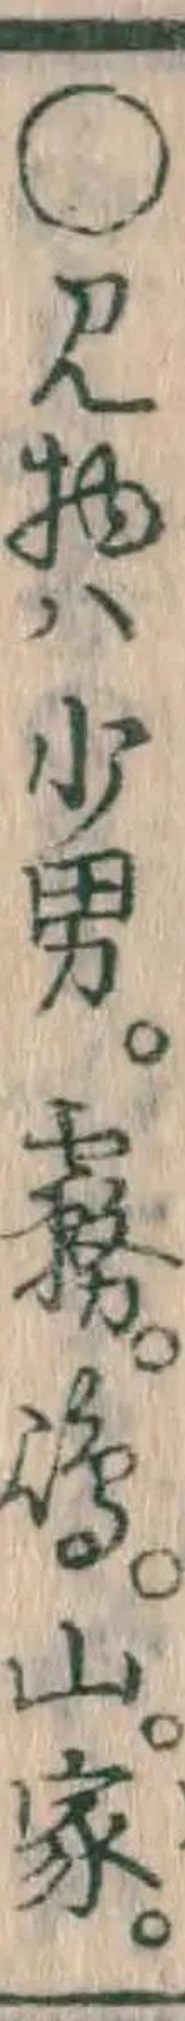○見物は少男。霧。島。山。家。
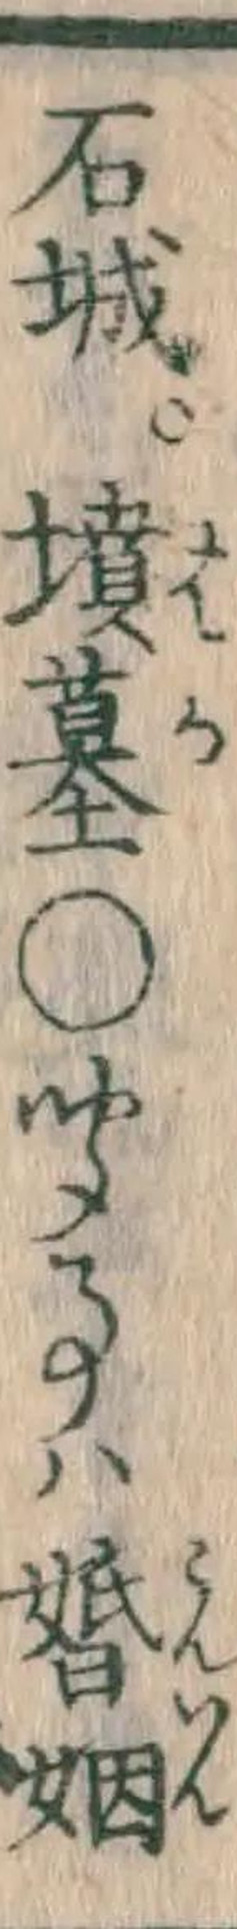石城。墳墓○聞事は婚姻
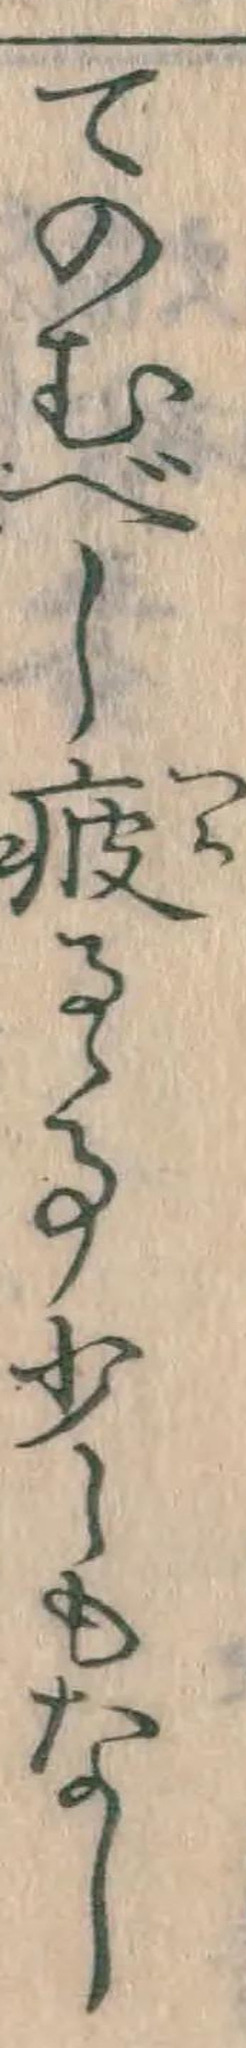てのむべし疲るゝ事少しもなし
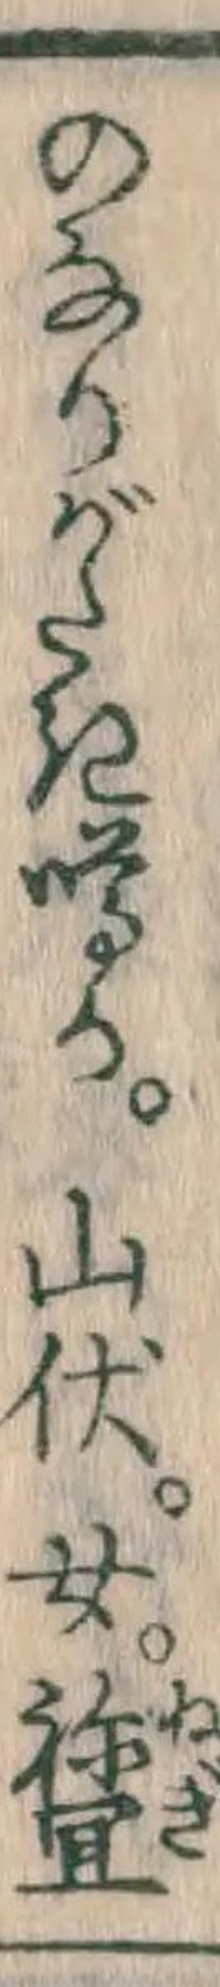のなりがたき噂か。山伏。女。祢宜
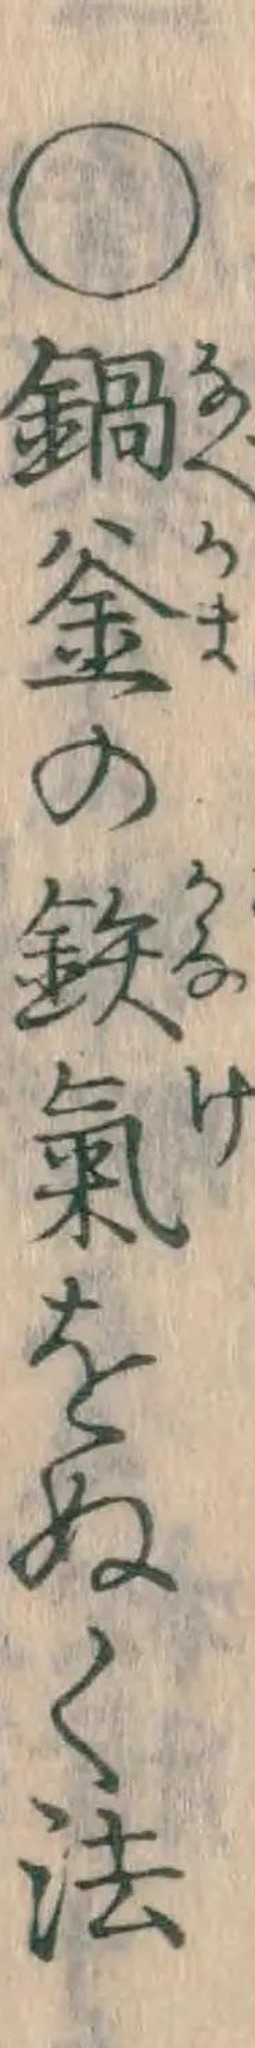○鍋釜の鉄気をぬく法
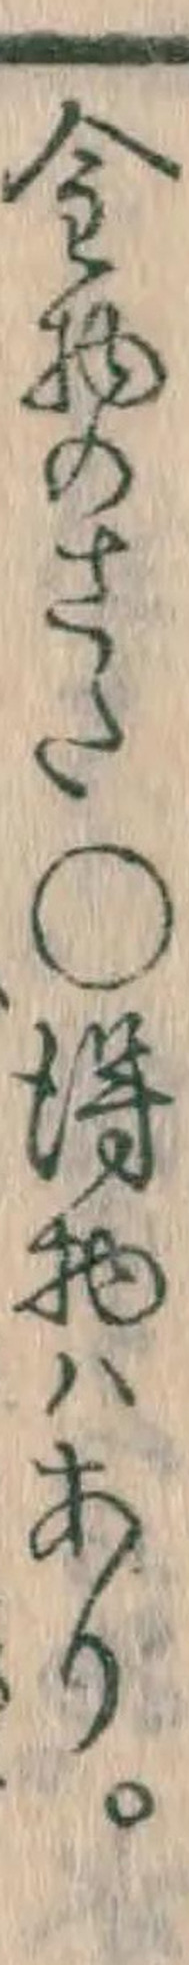金物のさた○得物はあり。
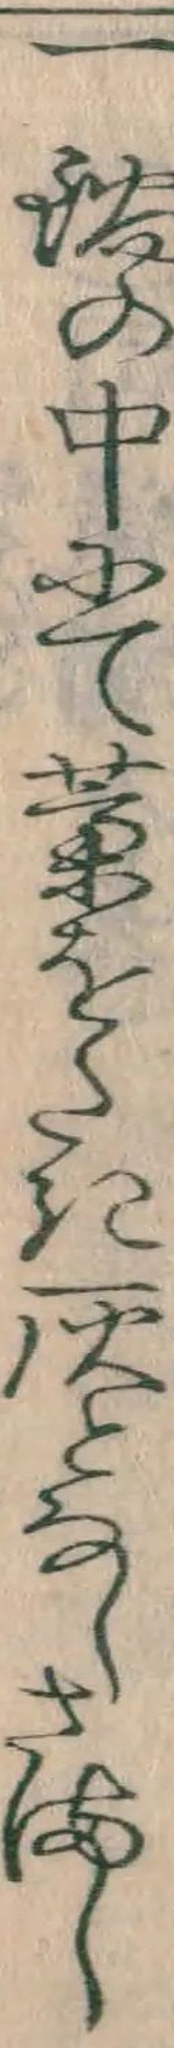一鍋の中にて藁をたき灰となしさまし
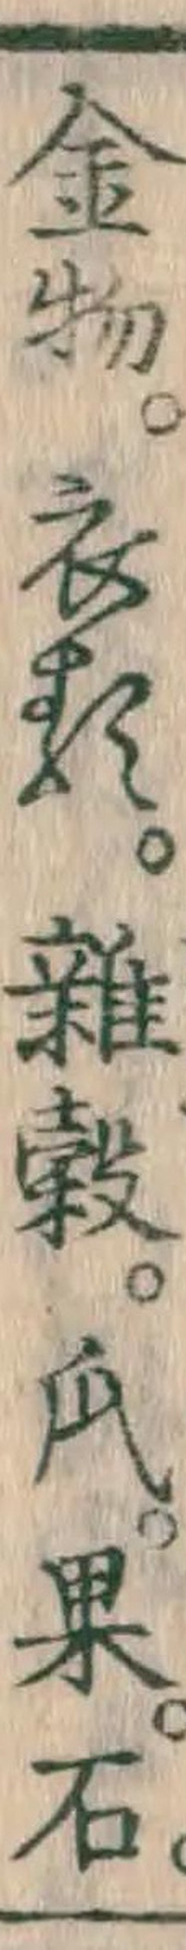金物。衣類。雑穀。瓜。果。石。
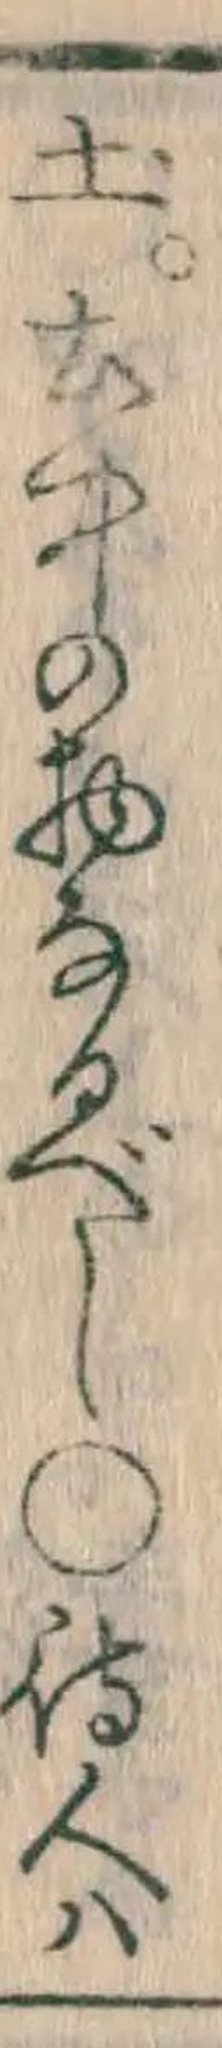土。土中の物なるべし○待人は
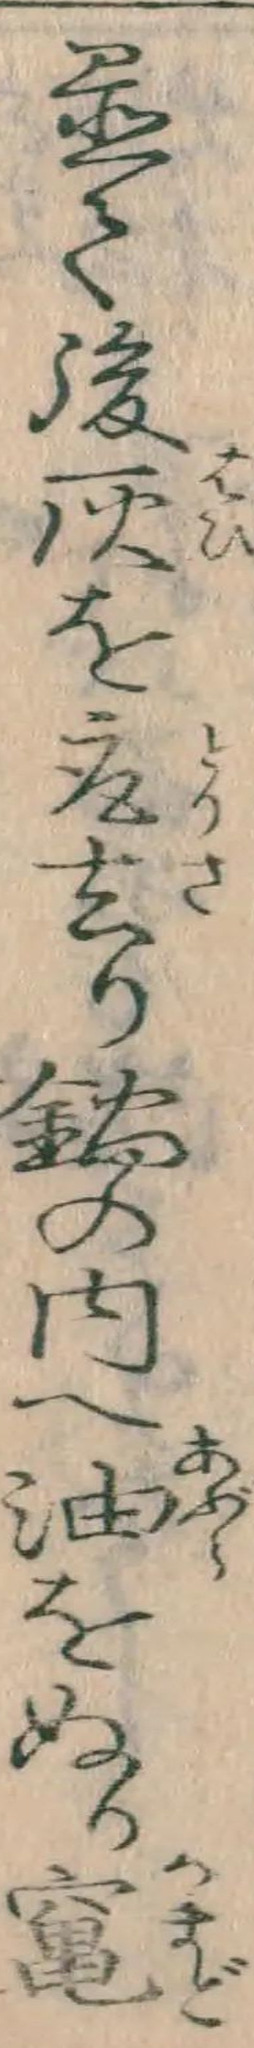置て後灰を取去り鍋の内へ油をぬり竈
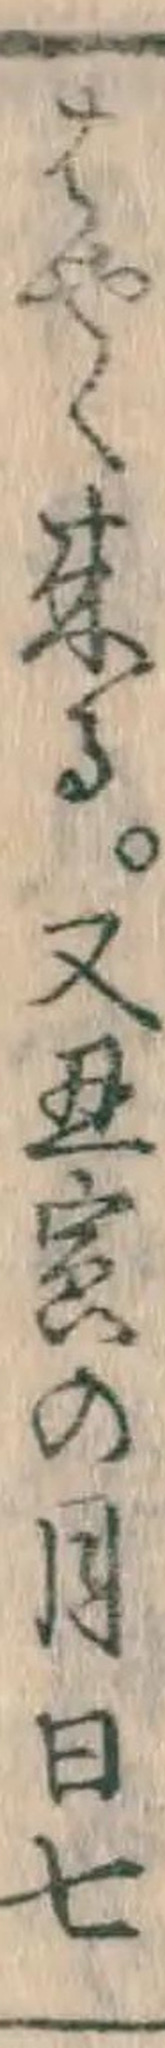はやく来る。又丑寅の月日七
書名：広益秘事大全 3巻. [1]
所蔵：国立国会図書館 National Diet Library, JAPAN
